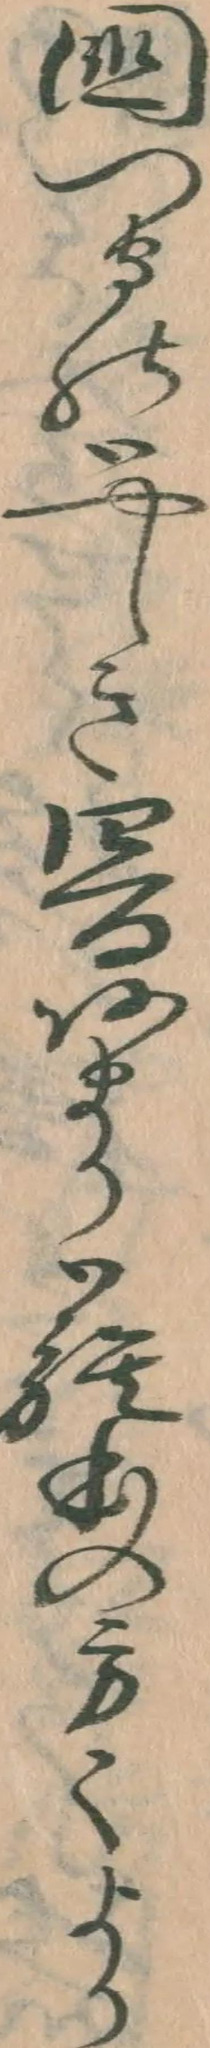国つ守の御やしき四百あまり御旗本の方々より
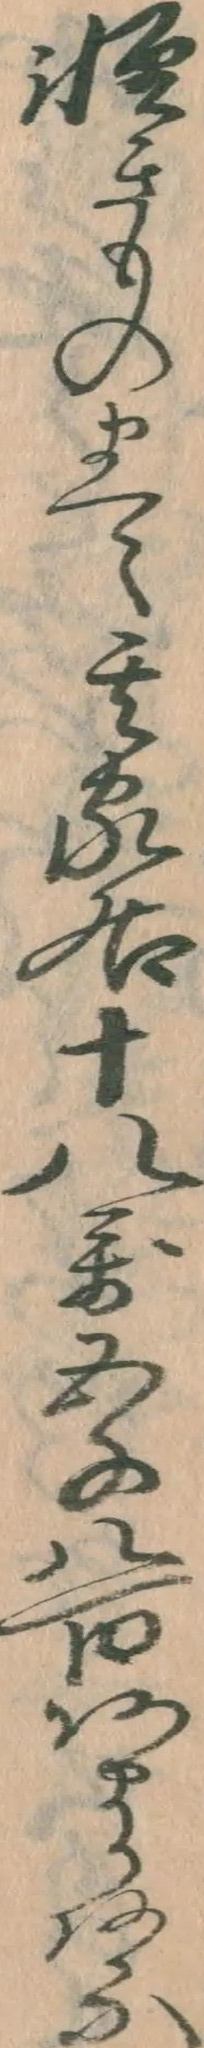輕きものまて其家居十八萬五千八百あまりある
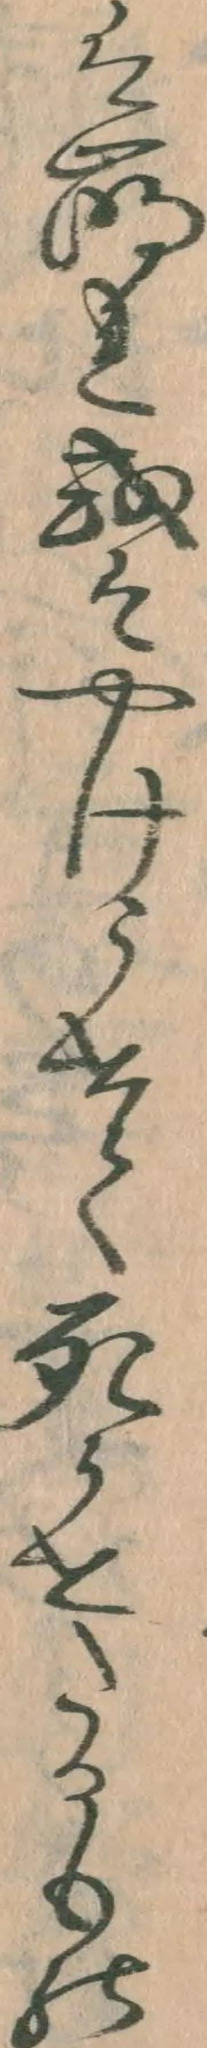は崩れ或はやけうせて死うせたるもの
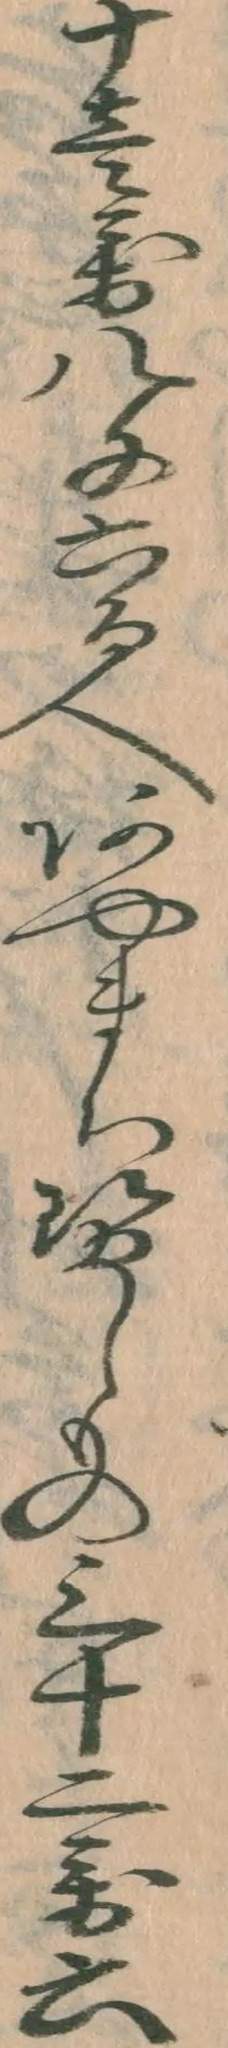十壱萬八千六百人あやまちせしもの三十二萬六
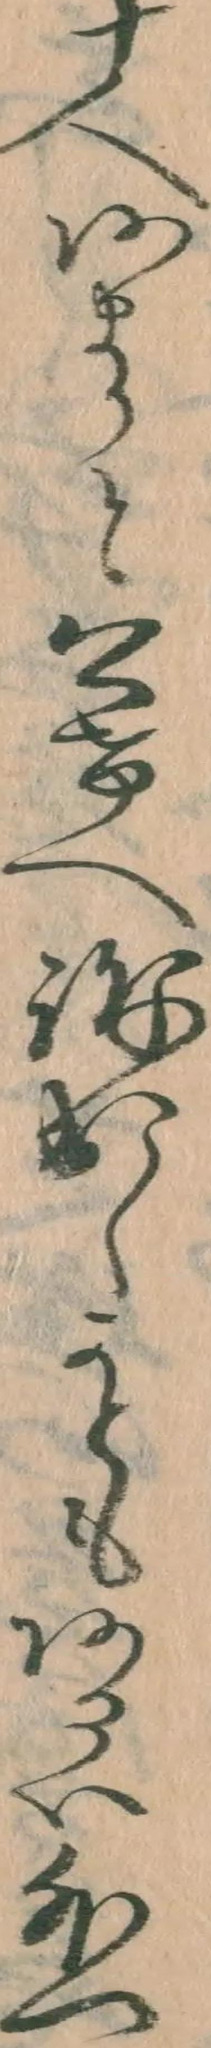十人あまりと公けヘ訴出しかともあるハ外つ
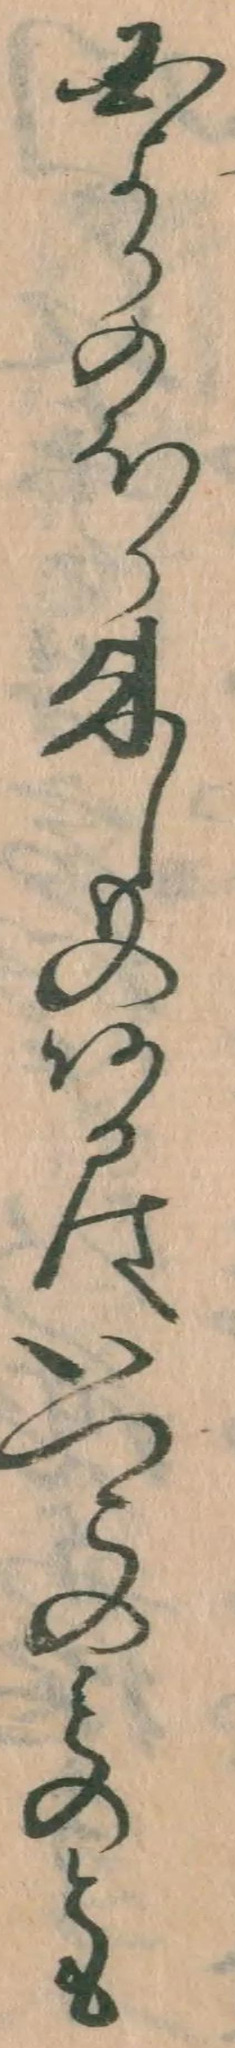国よりのほり来しものあるはいつこのものとも
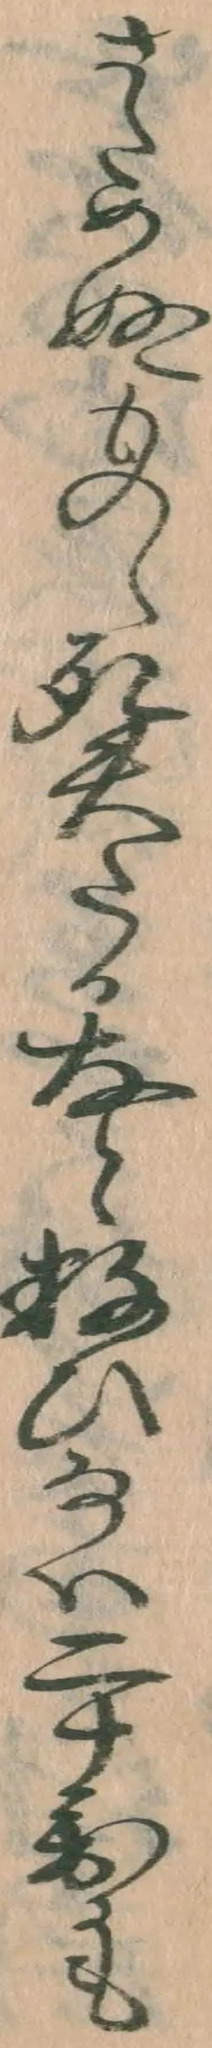さためぬものゝ死失たるなと数ひなハ二十萬にも
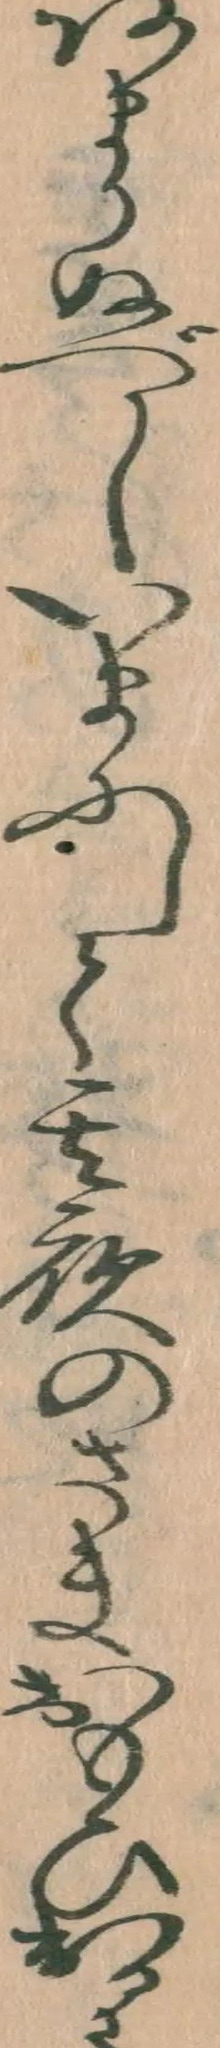あまりぬべしいまにして其夜のさまおもひ出るに
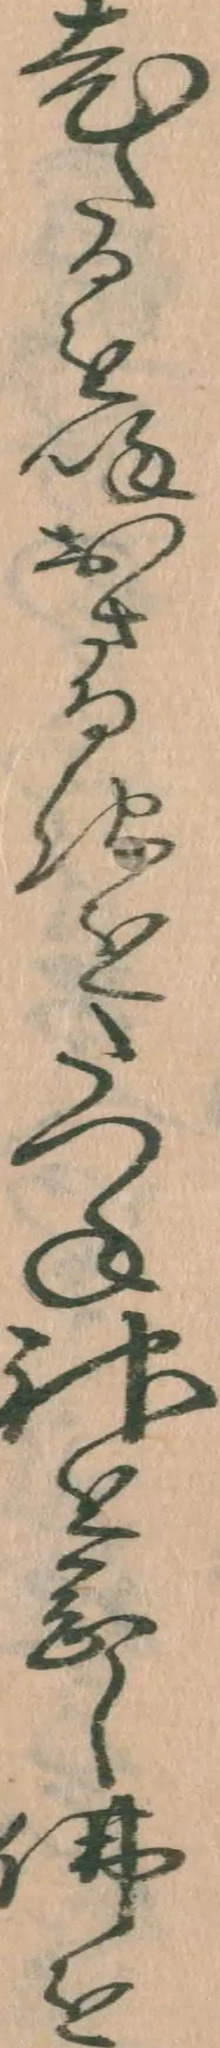老たるを呼おさなきをたつね神を念し佛を
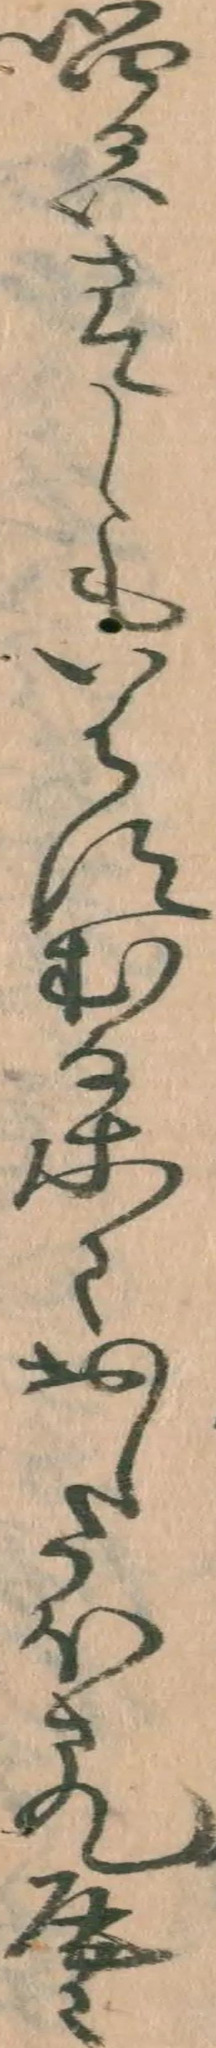唱るハさてしもいはすむな木におしたほされ瓦に
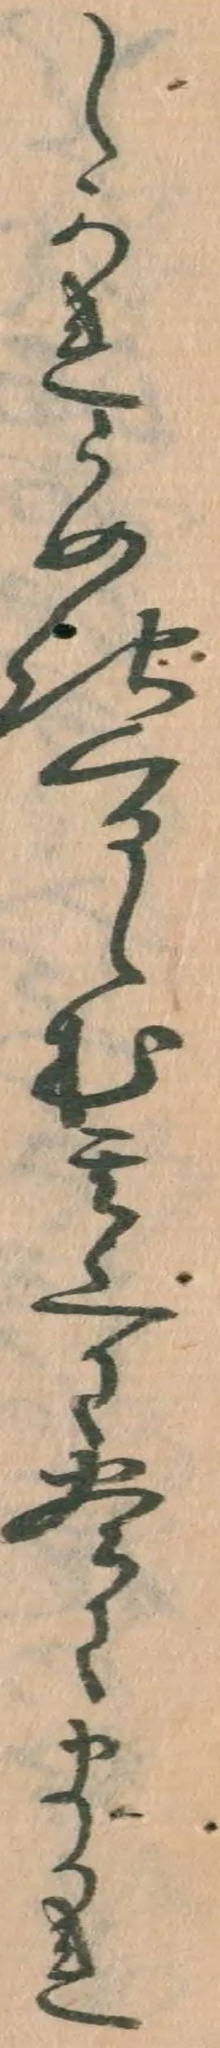しかれうめきくるしむ其上に炎にまかれ
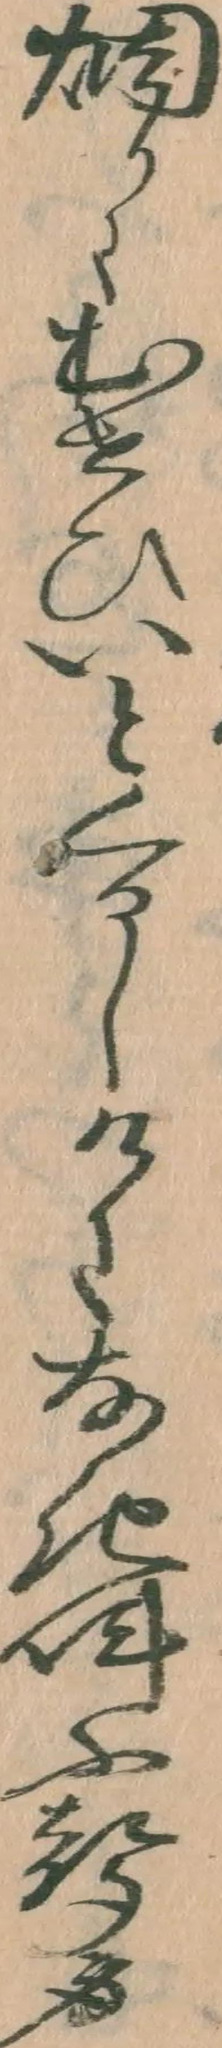烟りにむせひいとくるしけになき叫ふ聲身
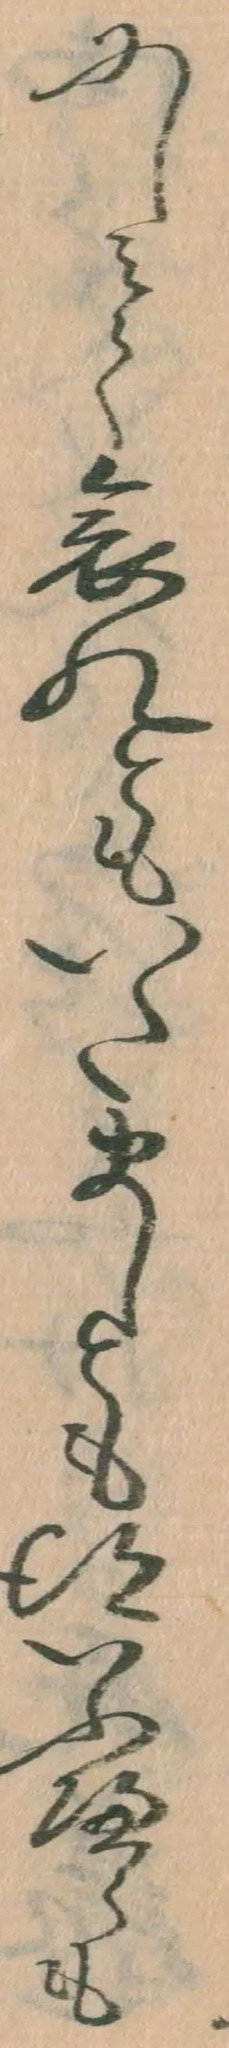にしミて哀れともいたましとも得いふへくも
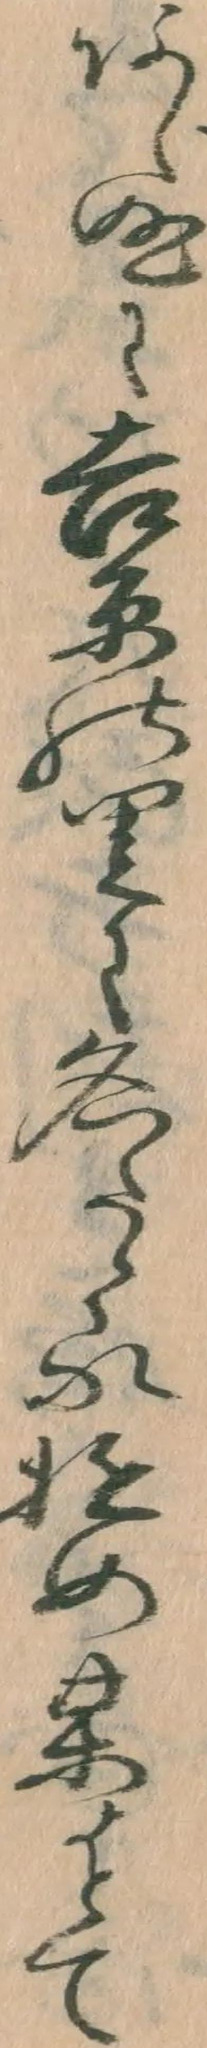あらぬに吉原の里に名たヽる遊め某よとて
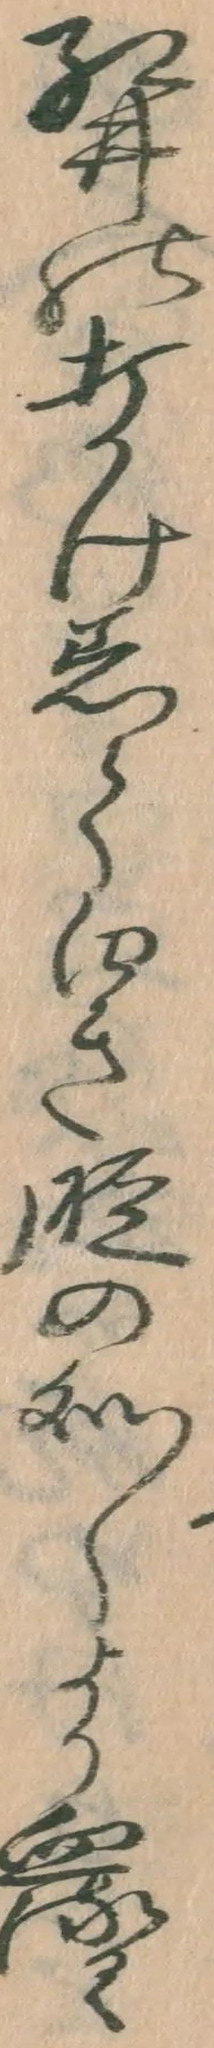紅井の打かけ着て白き脛の処〳〵より血流るヽ
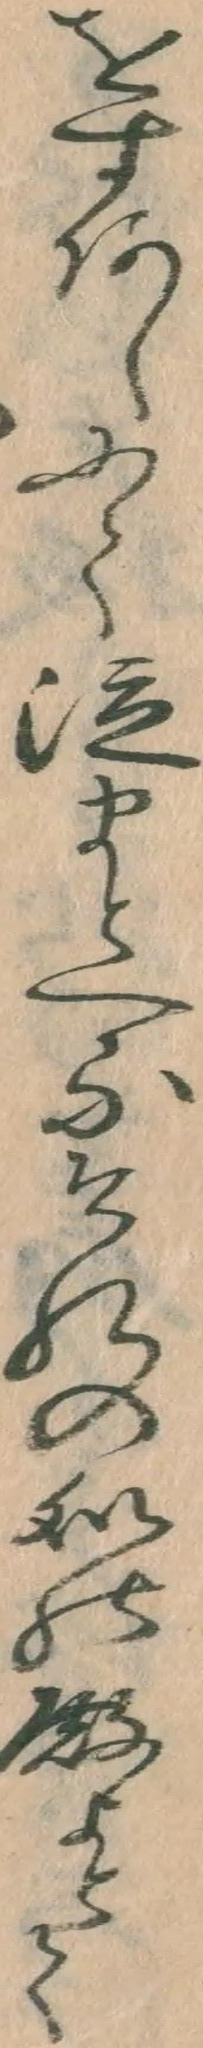をすあしにて泣まとへるそれの処の殿よとて
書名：麗斎叢書. 20
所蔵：国立国会図書館 National Diet Library, JAPAN
